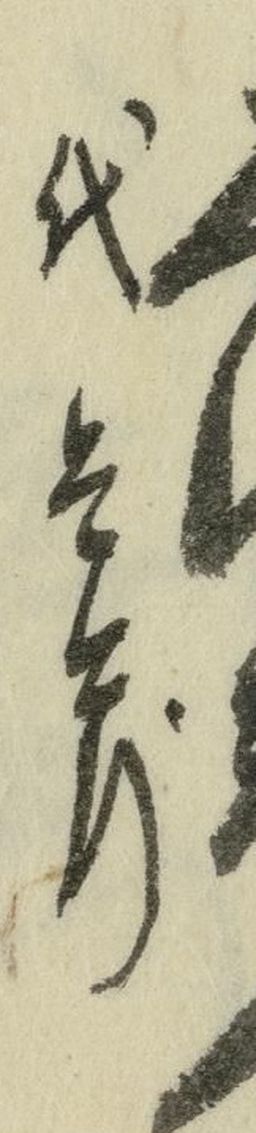代兵蔵
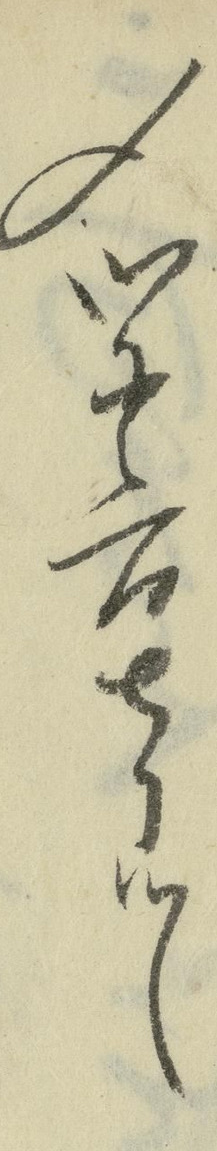〆弐貫百七十弐文

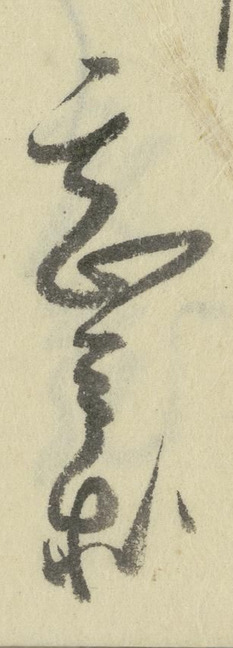甚兵衛
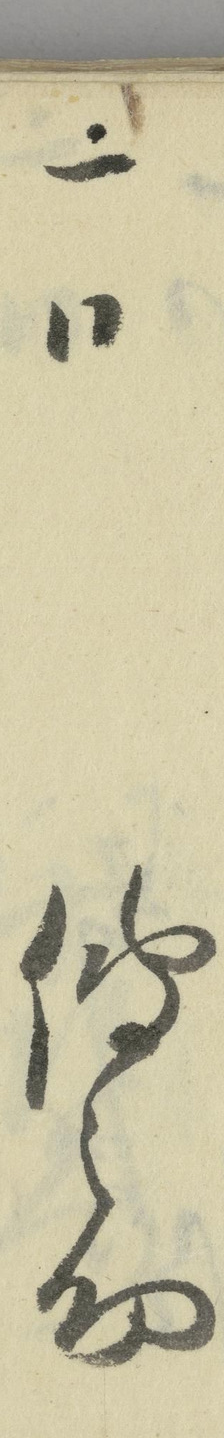一同伝之助
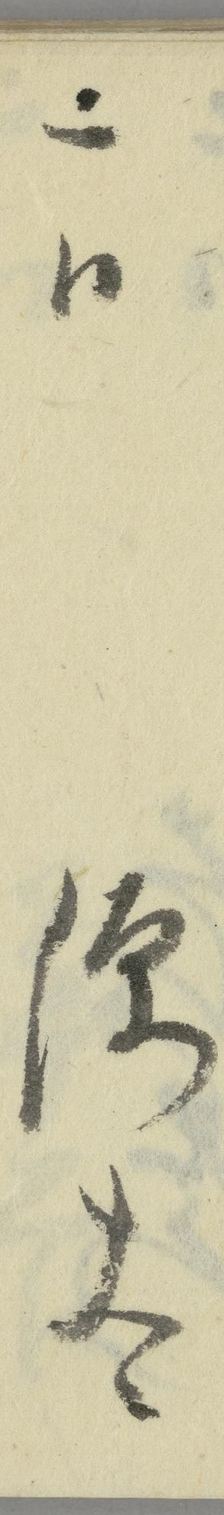一同定右衛門
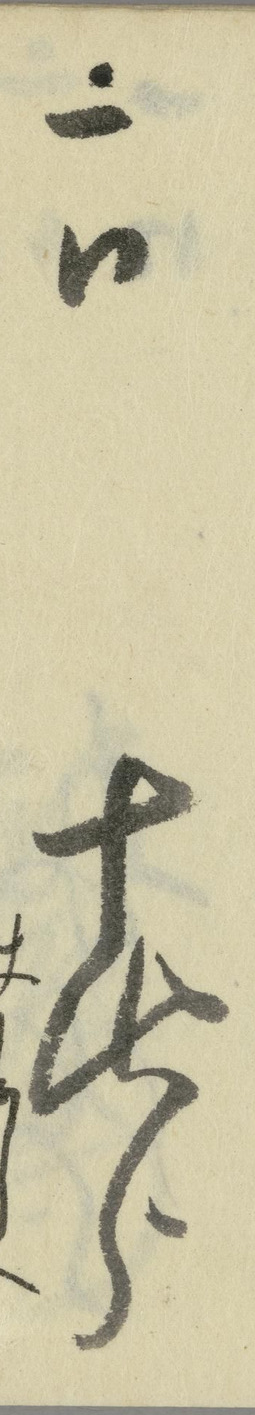一同十次郎
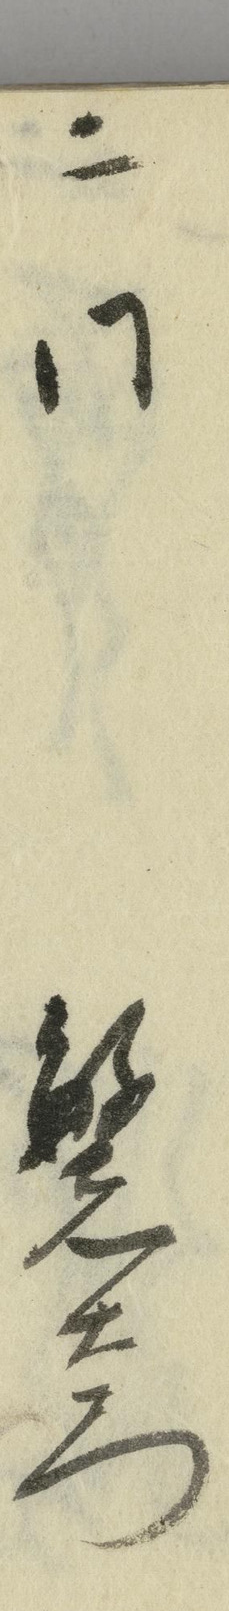一同定右衛門

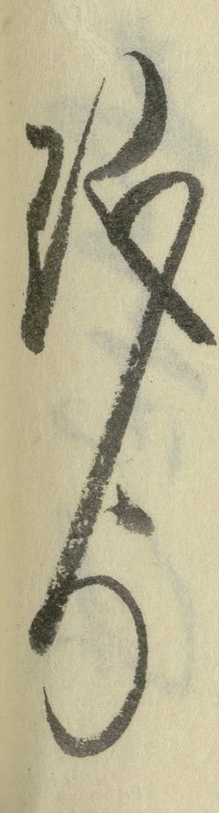庄右衛門
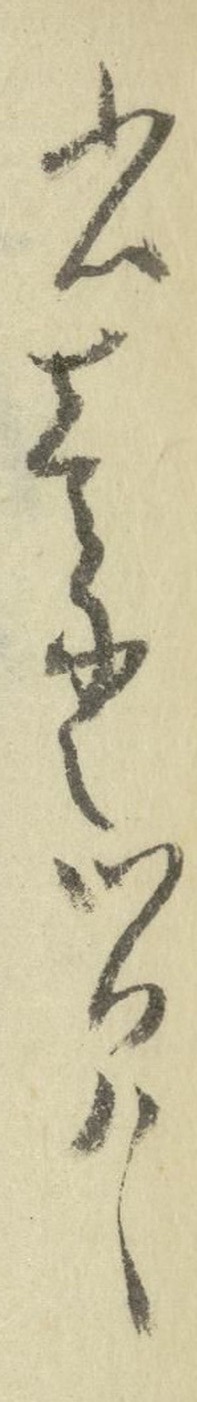小以壱貫弐百八文
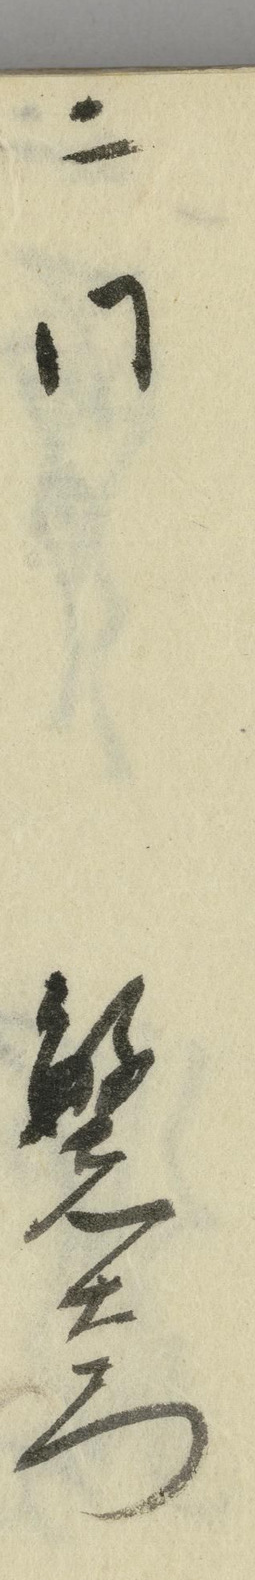一同誓右衛門
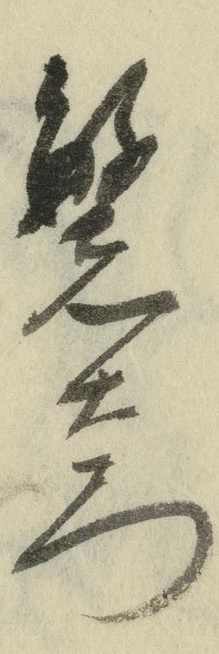庄右衛門
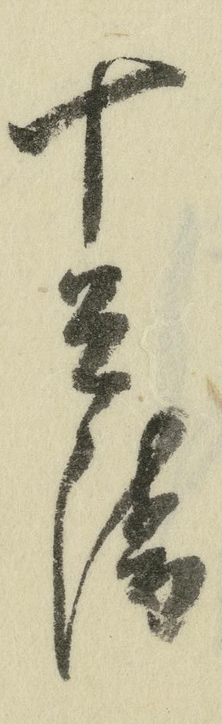十兵衛
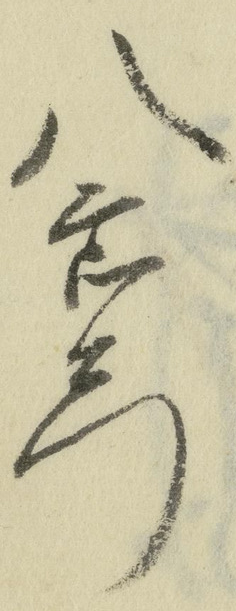八郎右衛門
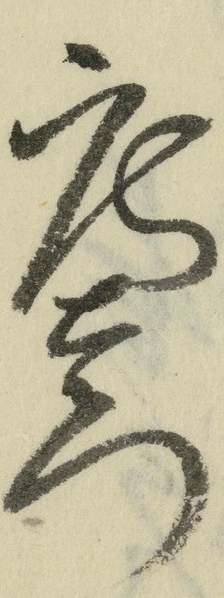庄右衛門

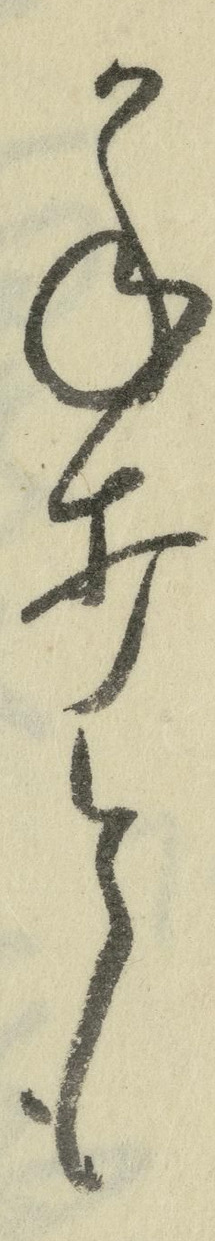かね打とも
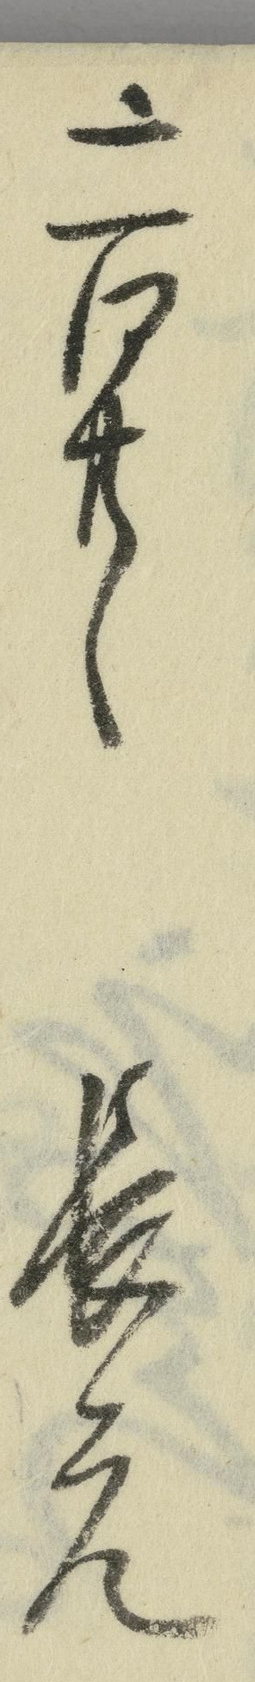一百廿文長元
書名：天明淺間噴火ニ関スル書類
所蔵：東京大学地震研究所図書室 Earthquake Research Institute Library, The University of Tokyo, JAPAN
